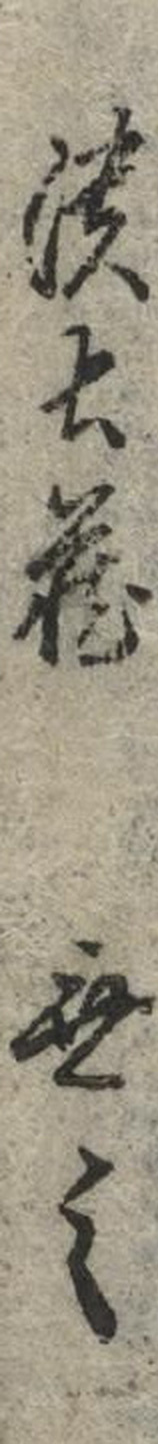潰土蔵無之
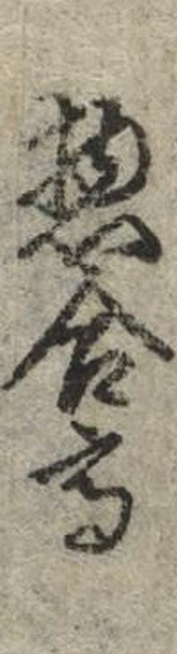惣合高
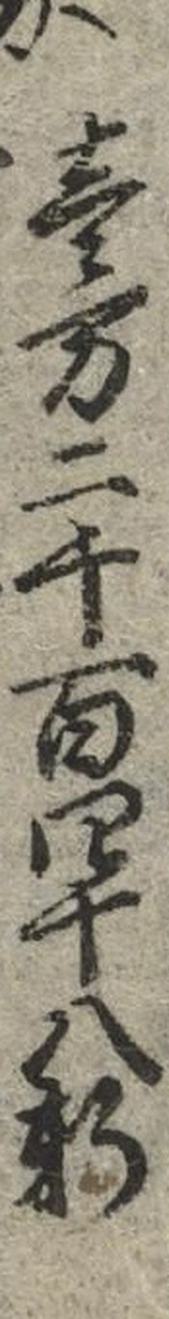潰家壱万二千百四十八軒
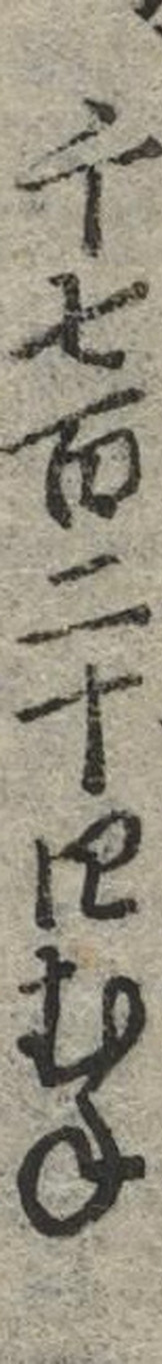千七百二十四むね
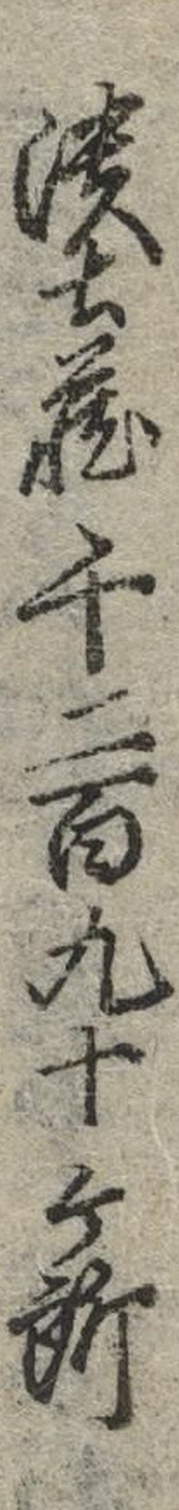潰土蔵千二百九十ケ所
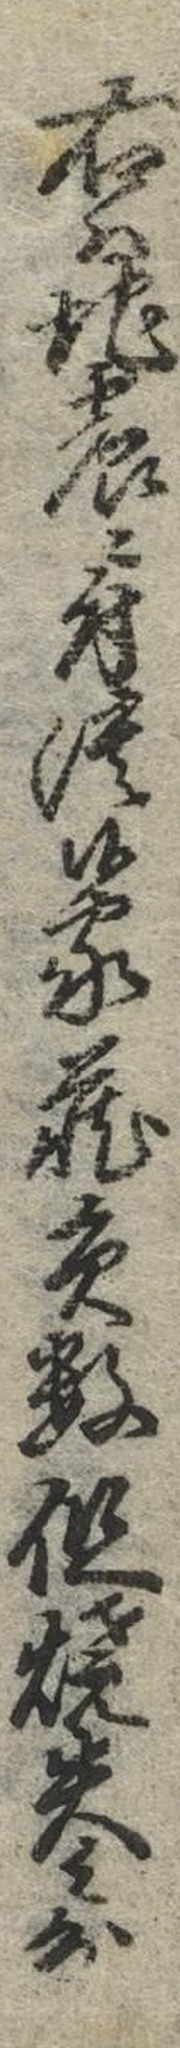右ハ地震ニ付潰候家蔵員数但焼失之分
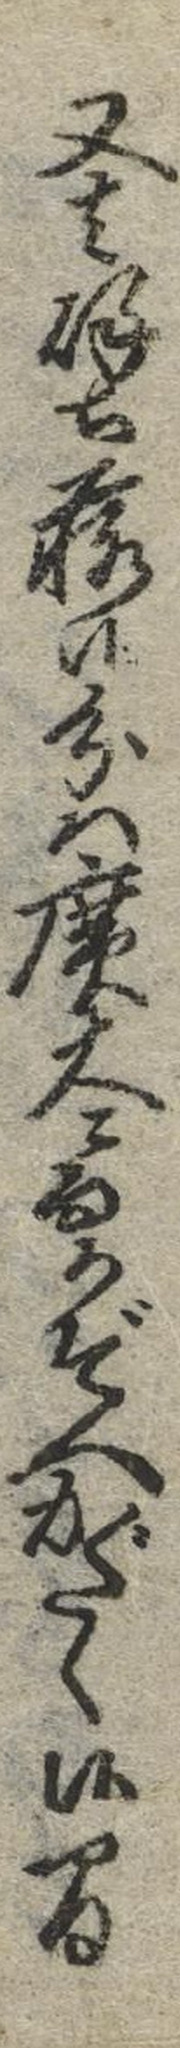又は壁落候分ハ広大ニ而かぞへがたく候間
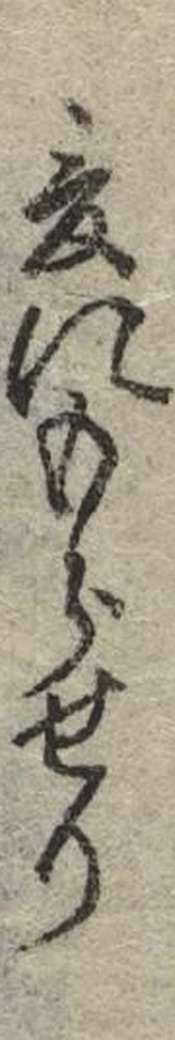爰にもらせり
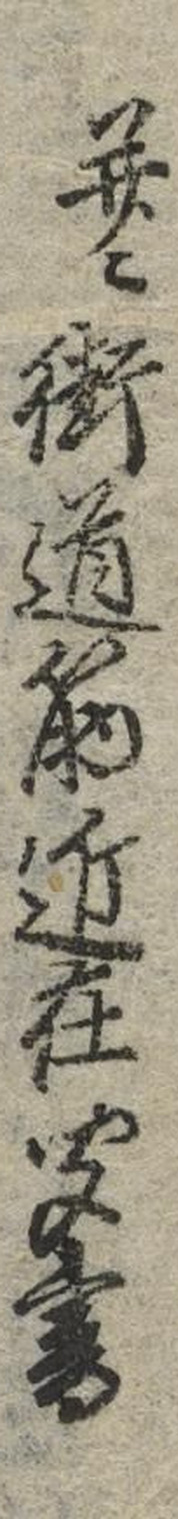并ニ街道筋近在聞書
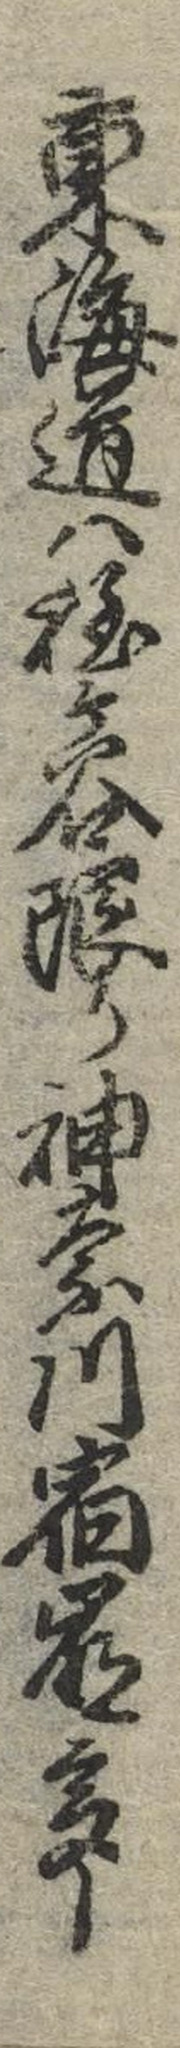東海道ハ程ケ谷限り神奈川宿崩多し
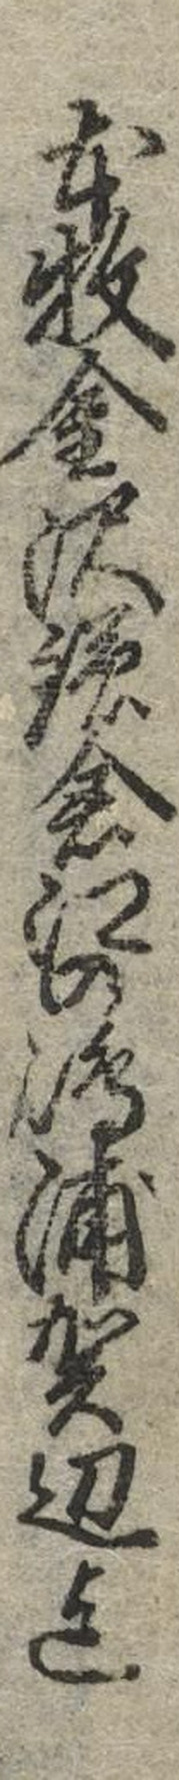本牧金沢鎌倉江の嶋浦賀辺迄
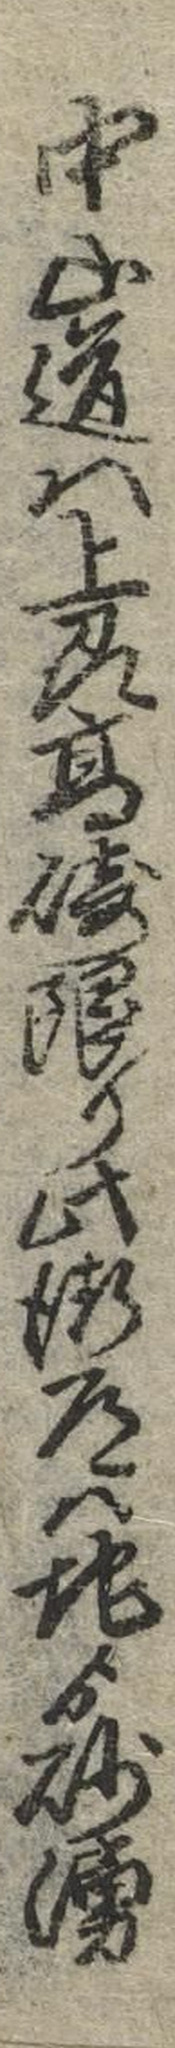中山道ハ上州高崎限り此街道ハ地ゟ砂湧
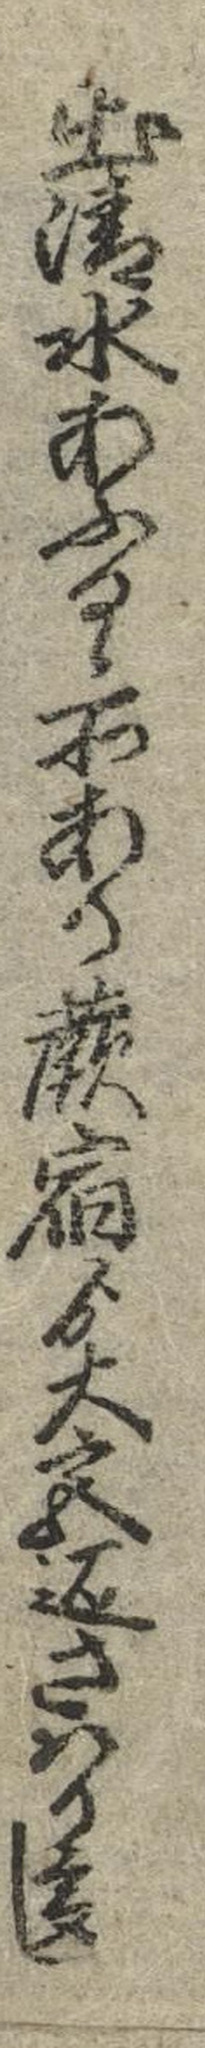出清水あふるゝ所あり蕨宿ゟ大宮辺さハり多し
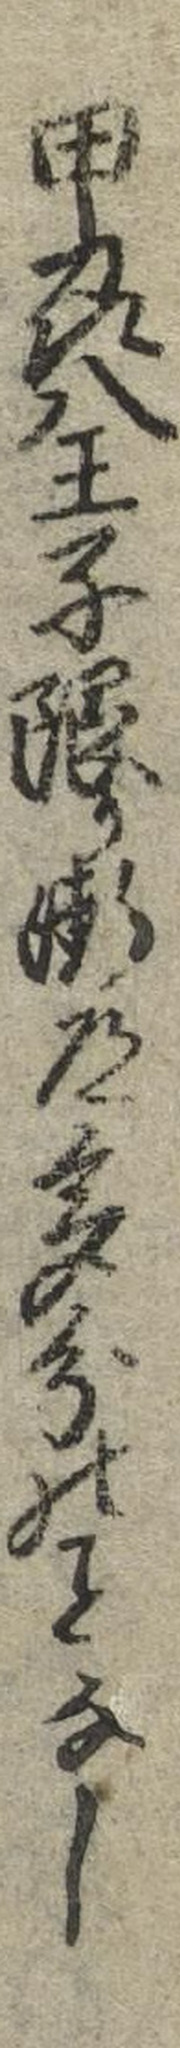甲州八王子限り街道多分のことなし

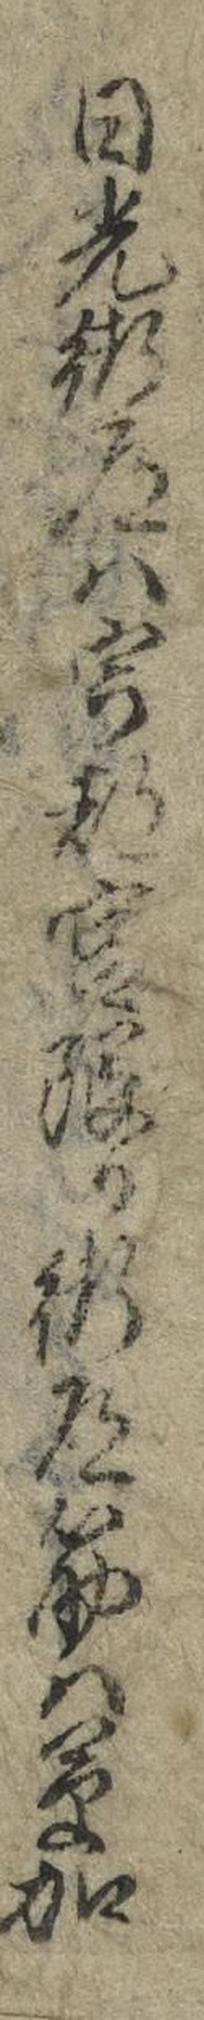日光街道ハ宇都宮限り街道筋ハ草加
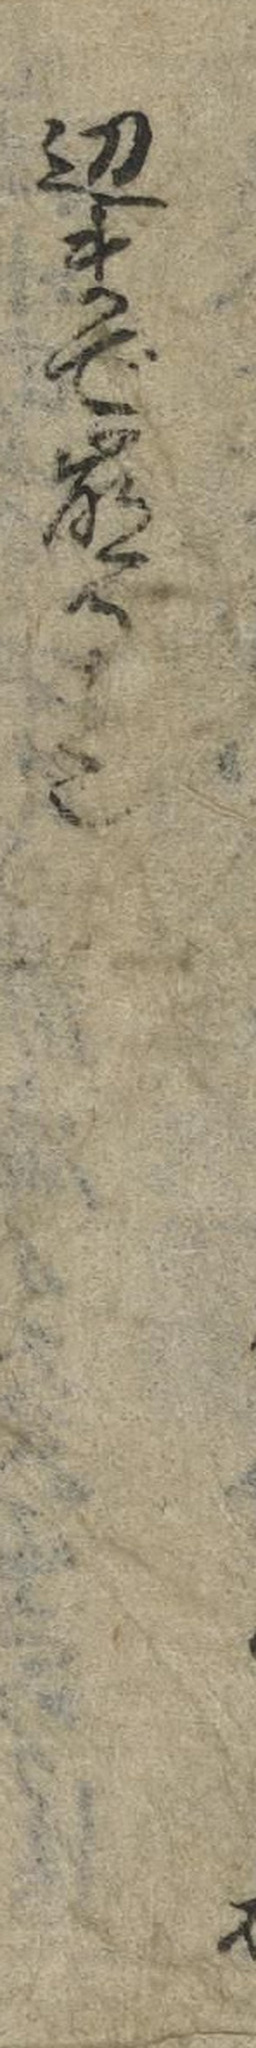辺まで崩る也
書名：江戸御屋鋪方町方共　地震類焼場所巨細書之寫　潰家潰土蔵共取調附街道筋近在迄
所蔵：東京大学地震研究所図書室 Earthquake Research Institute Library, The University of Tokyo, JAPAN
